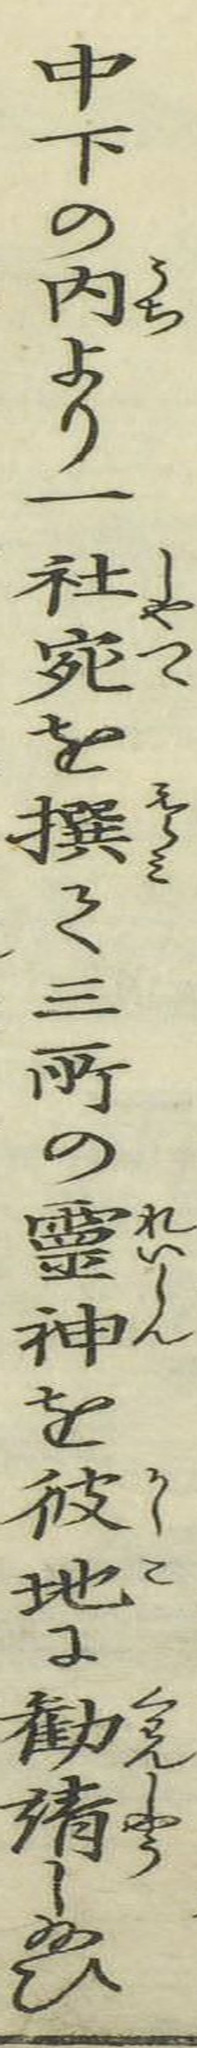中下の内より一社宛を撰て三所の靈神を彼地に勧請し給ひ
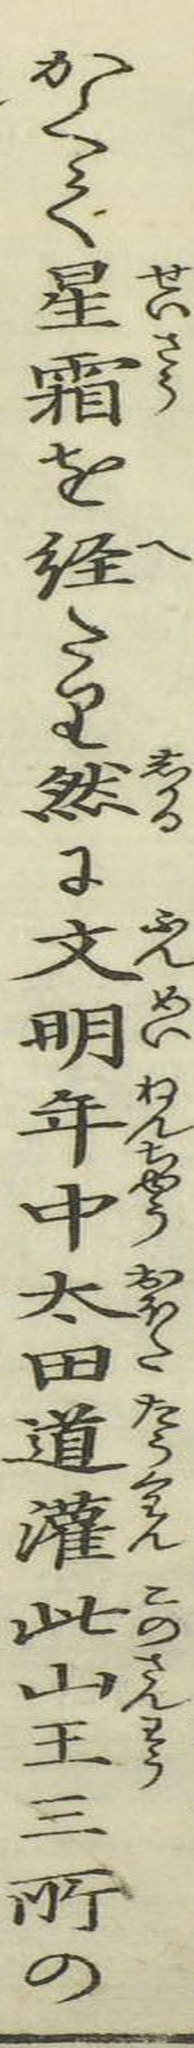かくて星霜を経たり然に文明年中太田道灌此山王三所の
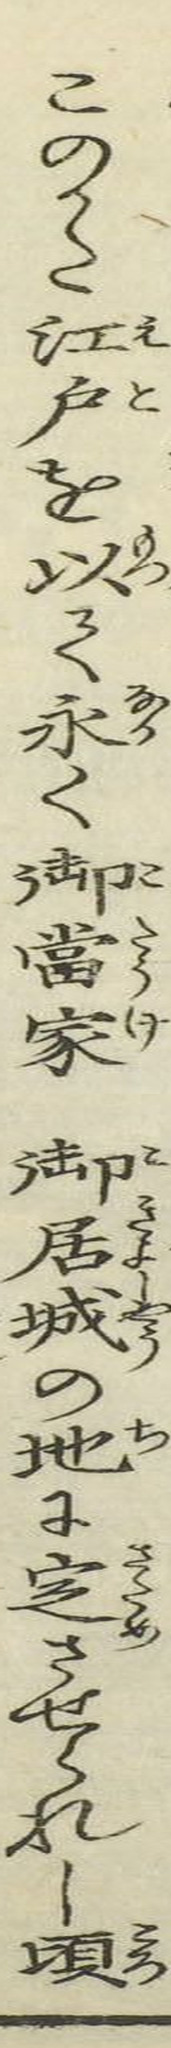このかた江戸を以て永く御當家御居城の地に定させられし頃
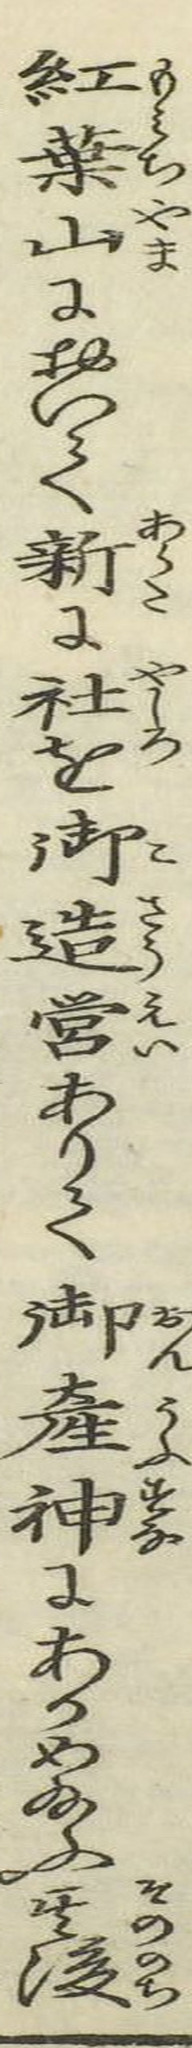紅葉山において新に社を御造営ありて御産神にあかめ給ふ其後
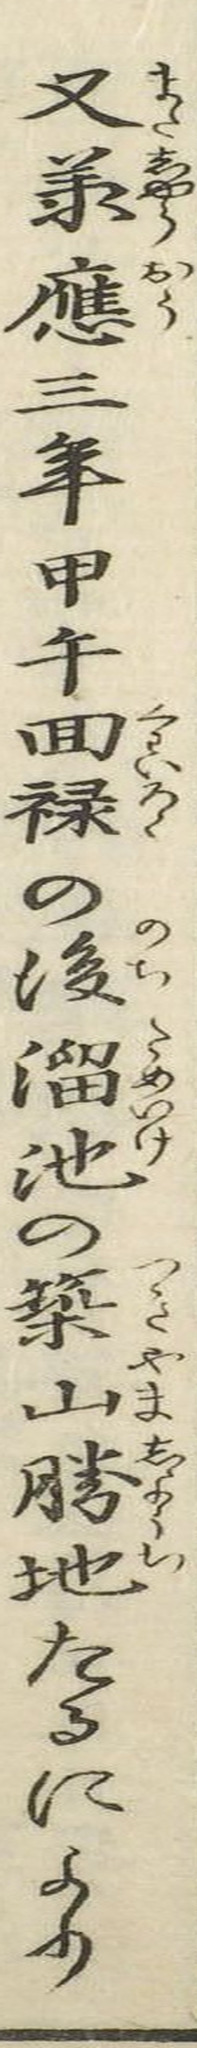又承應三年甲午回禄の後溜池の築山勝地たるにより
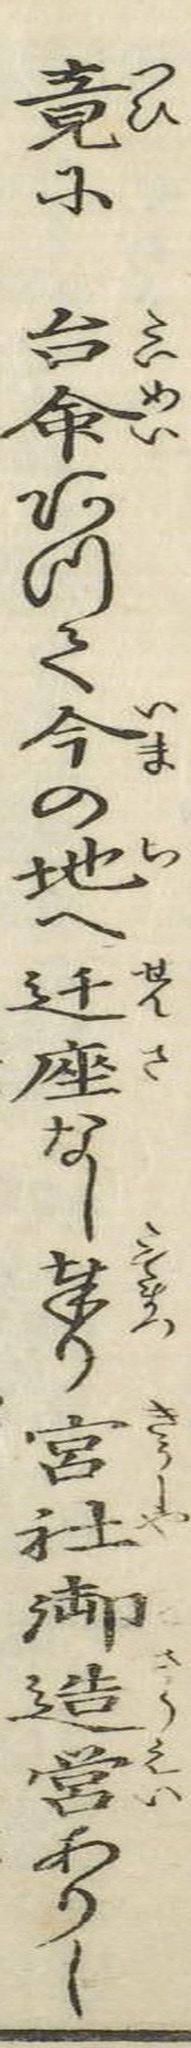竟に台命あつて今の地へ迁座なし奉り宮社御造営ありし
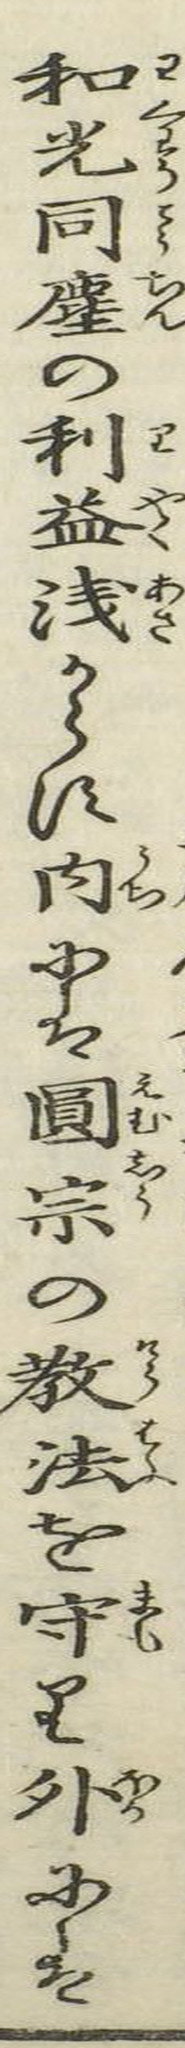和光同塵の利益浅からす内には圓宗の教法を守り外には
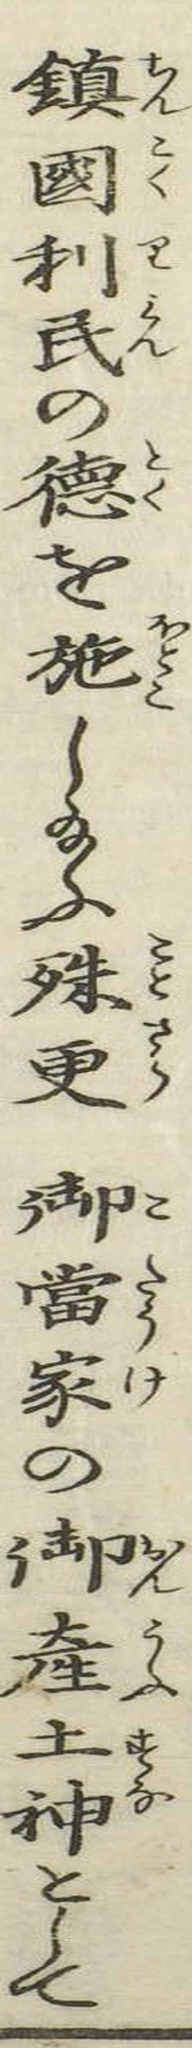鎮國利民の德を施し給ふ殊更御當家の御産土神として
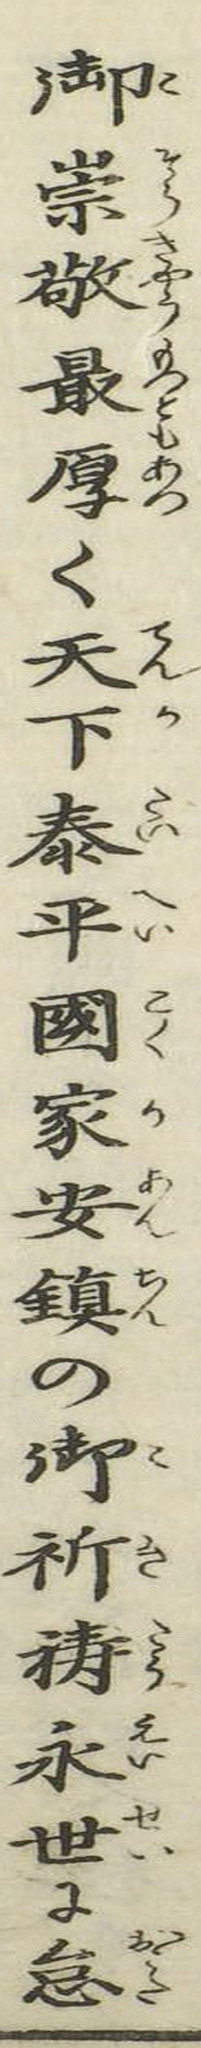御崇敬最厚く天下泰平國家安鎮の御祈祷永世に怠
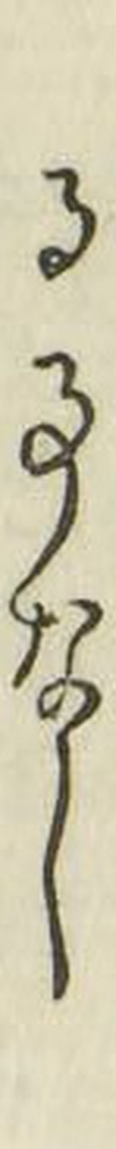る事なし
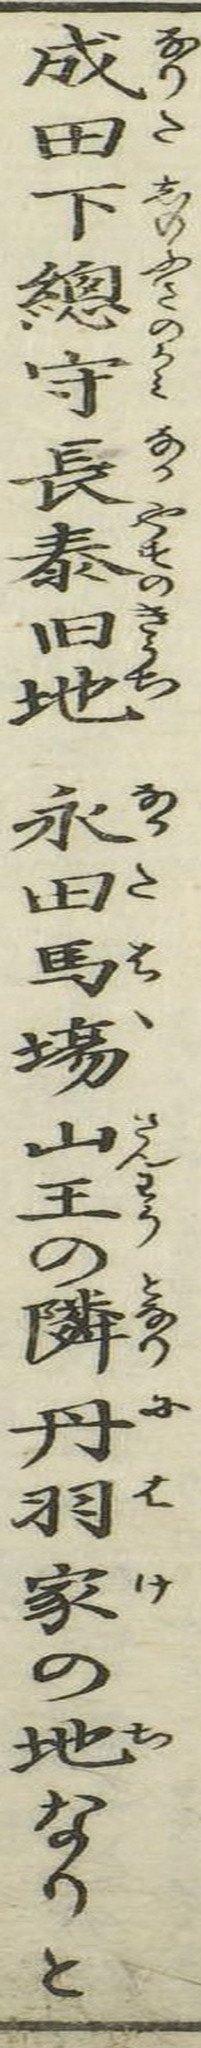成田下總守長泰旧地永田馬塲山王の隣丹羽家の地なりと
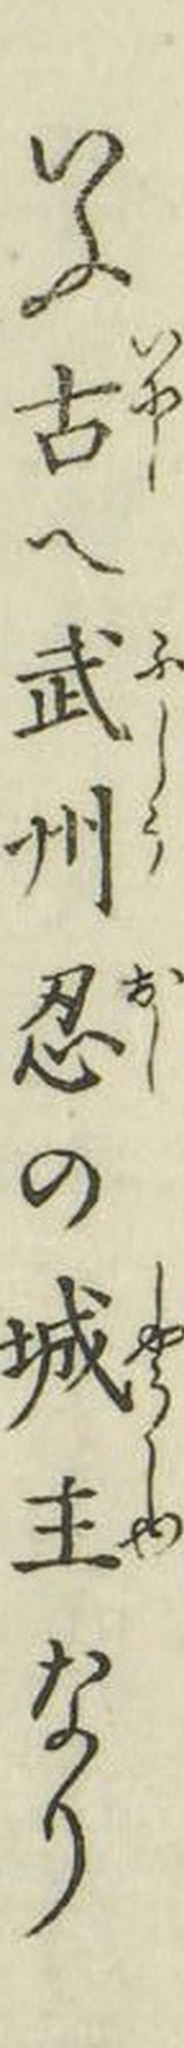いふ古へ武州忍の城主なり
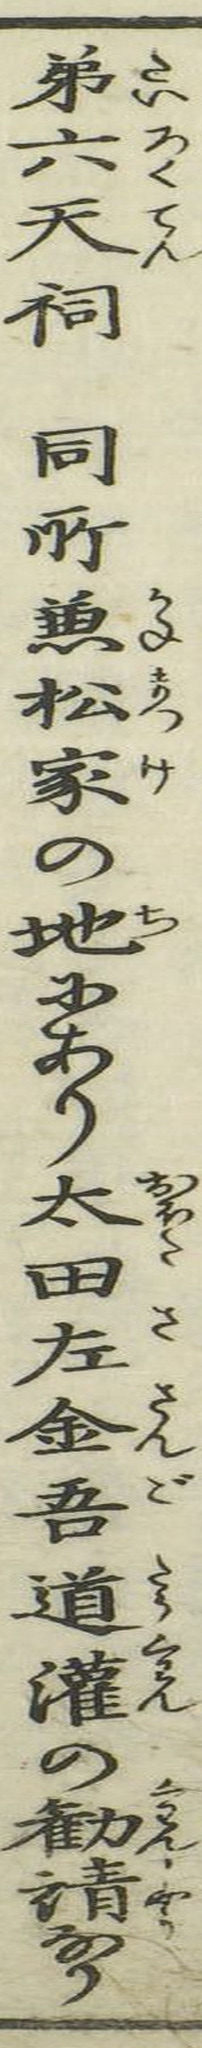第六天祠同所兼松家の地にあり太田左金吾道灌の勧請なり
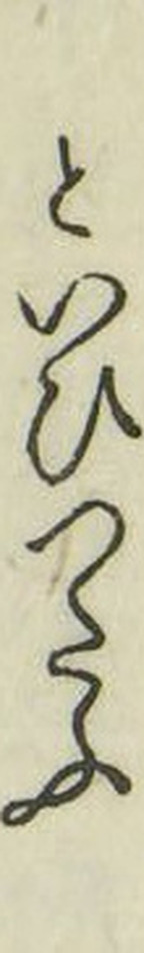といひつたふ

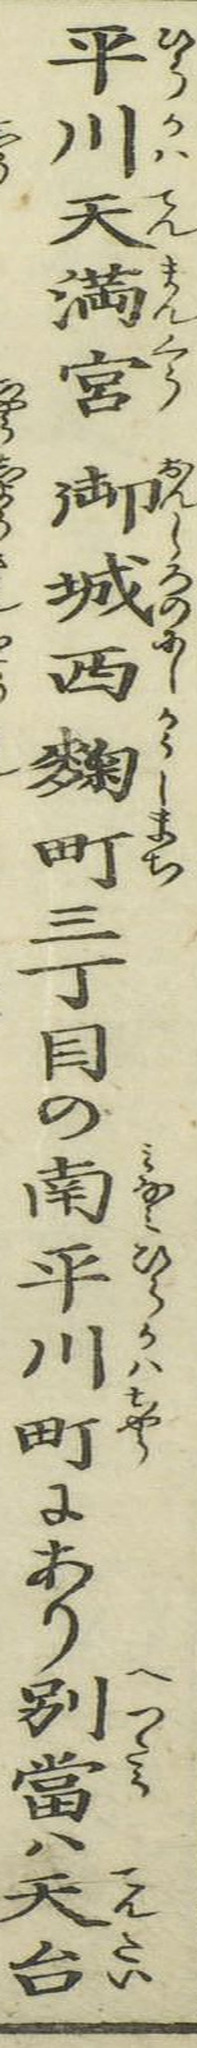平川天満宮御城西麴町三丁目の南平川町にあり別當は天台
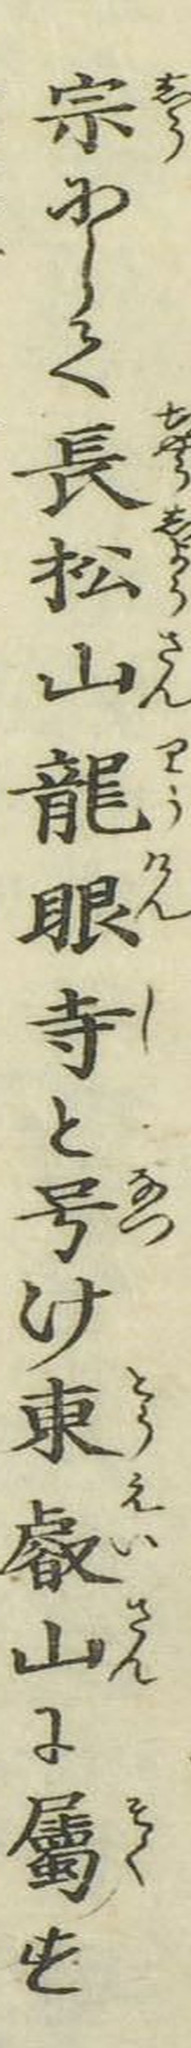宗にして長松山龍眼寺と号け東叡山に屬す
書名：江戸名所図会 20巻 巻之7
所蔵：東京学芸大学教育コンテンツアーカイブ
